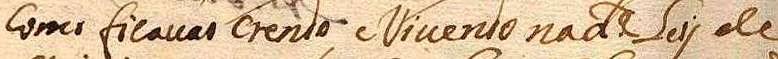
como ficauão crendo, e Viuendo na d.a Ley de
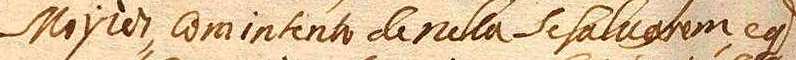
Moyzes, com intento de nella se saluarem, e q̄
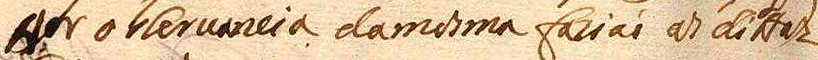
por obseruancia da mesma faziaõ as dittas
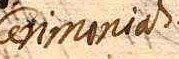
Cerimonias.
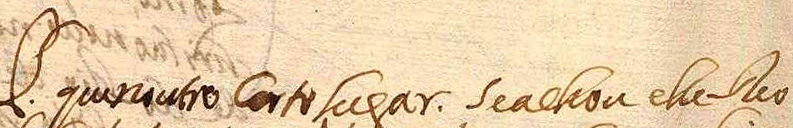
P. que noutro Certo Lugar. se achou elle Reo
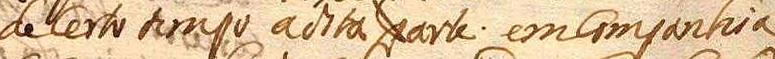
de certo tempo a esta parte. em Companhia
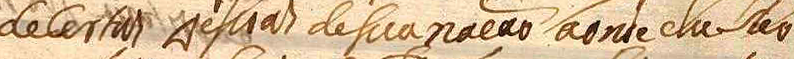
de Certas pessoas de sua nação aonde elee Reo
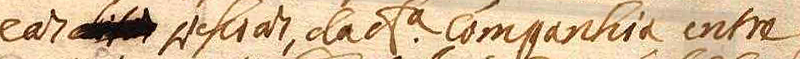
e as _ pessoas, da d.a companhia, entre
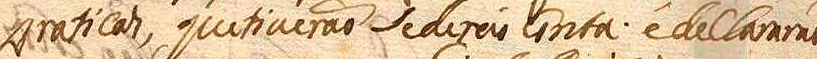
praticas, que tiuerão se derão conta. e declararão
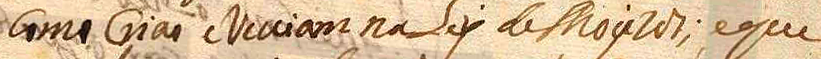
como crião e Viuiam na Ley de Moyzes; e que
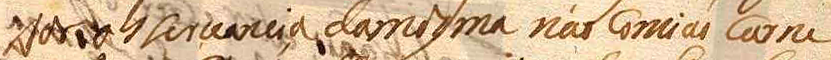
por obseruançia da mesma não comiaõ carne,
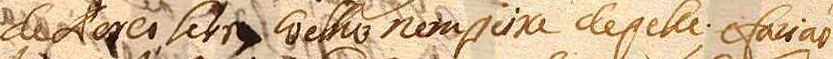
de Porco, lebre, coelho nem peixe de pelle; e faziaõ
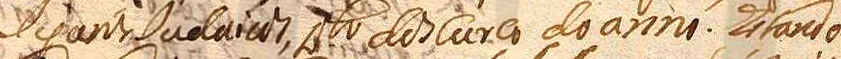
Iejuns Iudaicos, p.lo descurço do anno. Estando
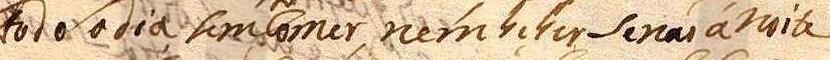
todo o dia, sem comer, nem beber senão á noite
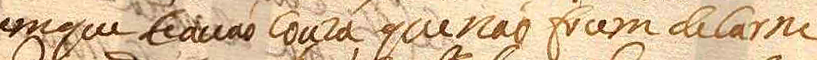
em que ceauaõ couza, que não focem de carne
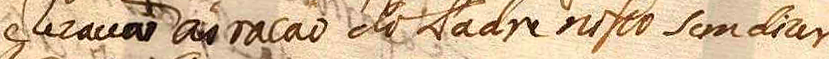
e Rezauaõ a oracaõ do Padre nosso sem dizer
